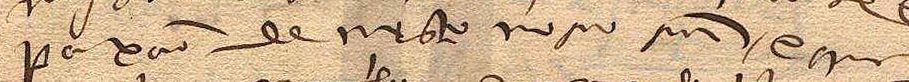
paxaõ de crysto noso sor̄ / e que
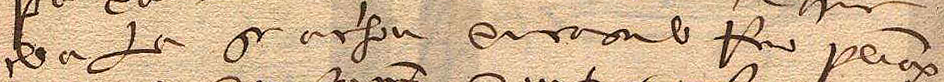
ella ta se achou em casa do Reo pllās
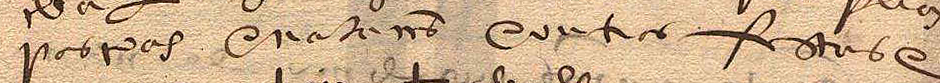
pascoas e nataeēs e outras festas e
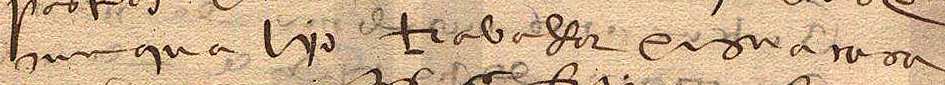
nunqua vyo trabalhar em sua casa
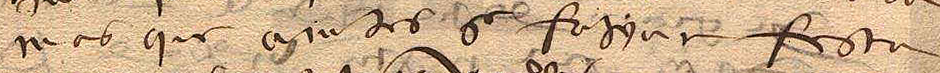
mas que amtes se fazyam festa
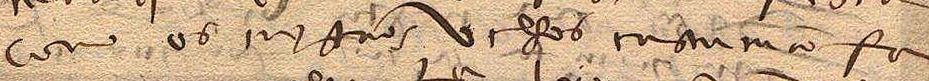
como os crystaõs velhos custumão fa
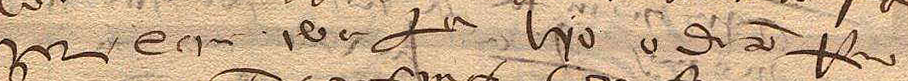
zer / e que ella ta vyo o ditō Reo
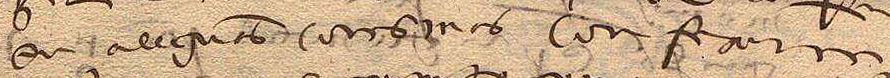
em allgūas coresmas confesarce
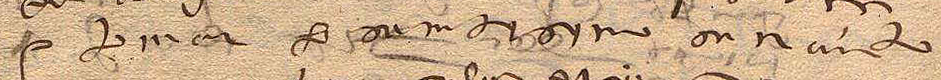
e tomar ho samtysymo sacramto
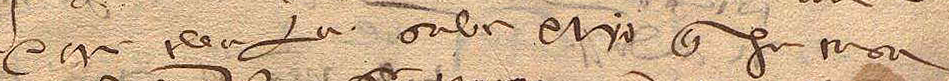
e cre ella ta sabe e vyo q̄ ha casa
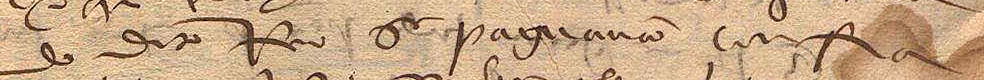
do dito Reo se paguauaõ confra
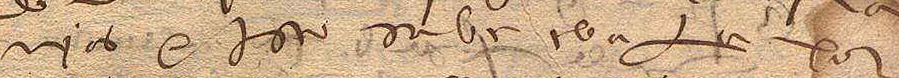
ryas e Jsto sabe ella ta por
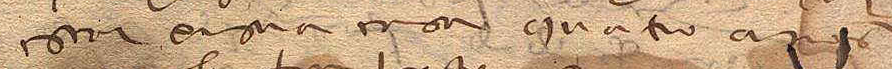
estar em sua casa quatro anos
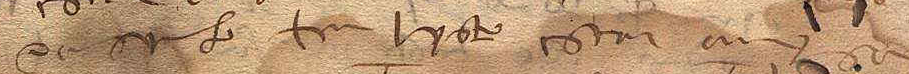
e asy ho tem vysto estar a mysa
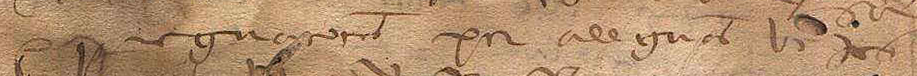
e preguaçoẽes por allguās vezes
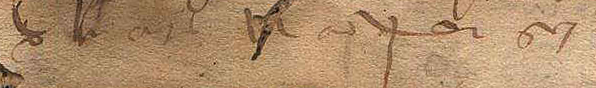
e majs naõ dise /
